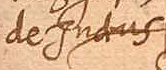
de Judeus
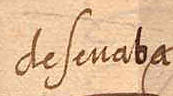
de seuaba
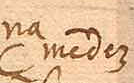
Cna mēdez
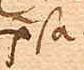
p̄sa
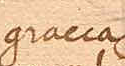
gracia
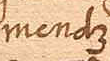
mendz
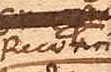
Reconci
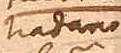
liada no
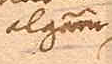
algāue
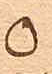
O
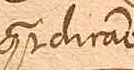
ꝯ̄tdição
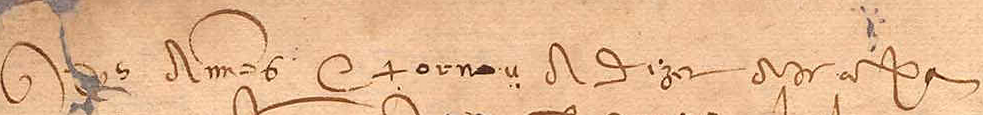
seys An̄nos e tornou A dizer Ate aꝟa
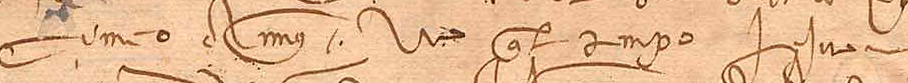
Cinco An̄nꝯ /. No q̄l tempo Jejuou
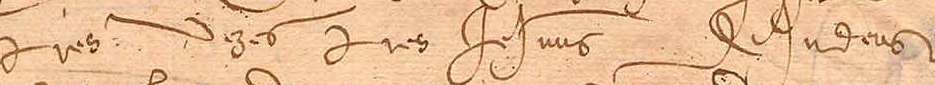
tres vezes tres JeJūus de Judeus
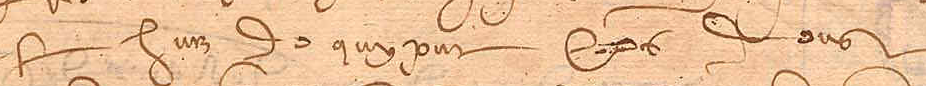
s. hum do quypur e os dous
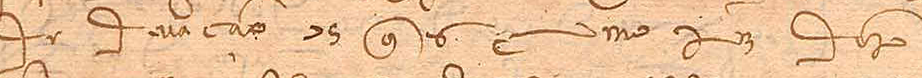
de deuaçaõ os q̄es como tem dito
